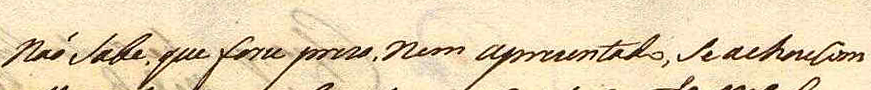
naõ sabe que fosse prezo, nem aprezentado, se achou com
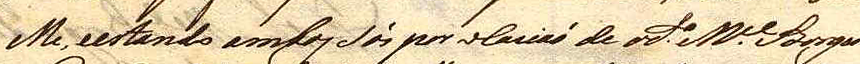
elle, e estando ambos sós por oCaziaõ de o d̄.o M.e Borges
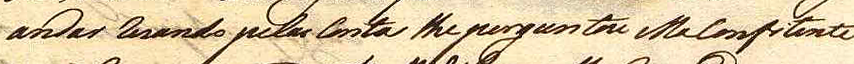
andar Rezando pelas conta lhe perguntou ella confitente
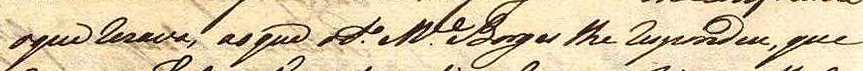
o que Rezava, ao que o d̄.o M.e Borges lhe Respondeu, que
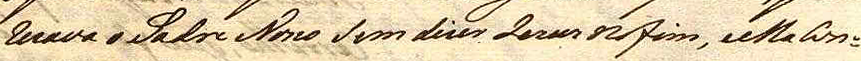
Rezava o Padre Nosso sem dizer Iezus no fim, e ella con
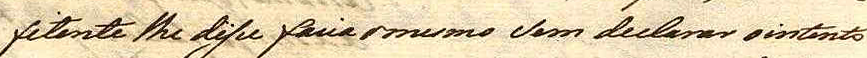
fitente lhe disse fazia o mesmo sem declarar o intento
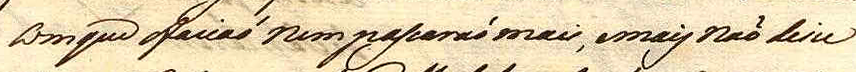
com que o faziaõ nem passaraõ mais, e mais naõ disse
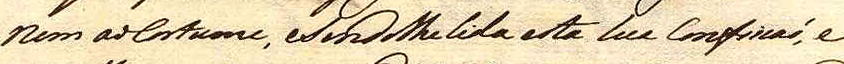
nem ao Costume, e sendolhe lida esta sua Confissaõ, e
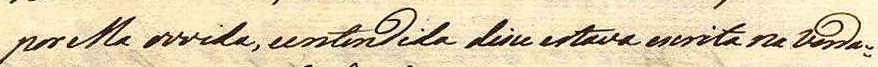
por ella ouvida, e entendida disse estava escrita na verda
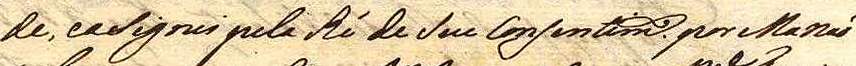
de, e asignei pela Ré de seu Consentim.to por ella naõ
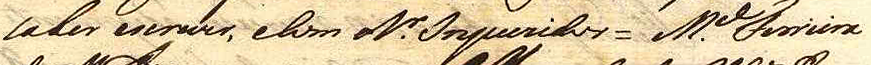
saber escrever, e Com o s.r Inquizidor = M.el Ferreira
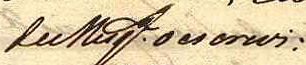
de Mesq.ta o escreui:
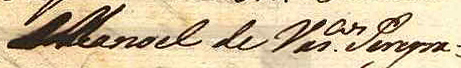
Manoel de Vas.cos Pereyra.
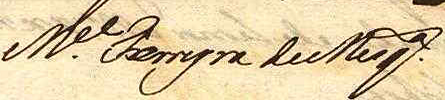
M.el Ferreyra de Mesq.ta
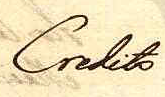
Credito
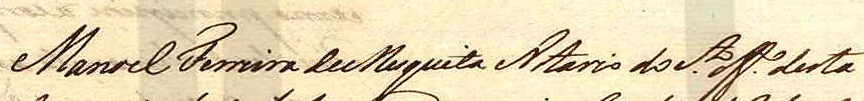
Manoel Ferreira de Mesquita Notario do S.to off.o desta
